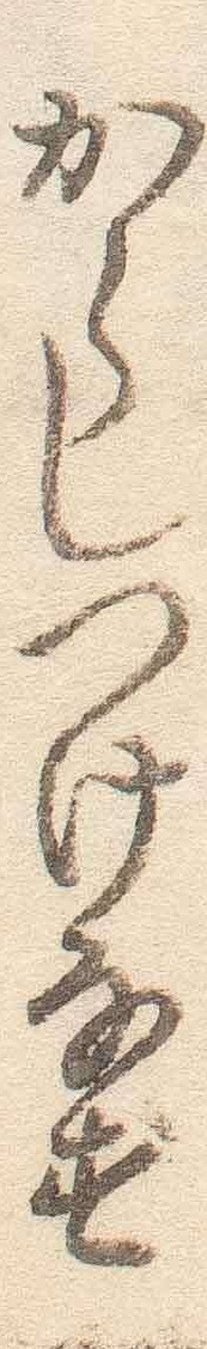からしつけなす
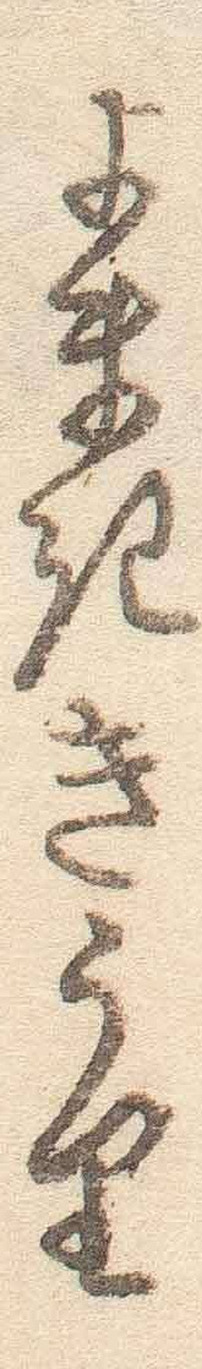よまききうり
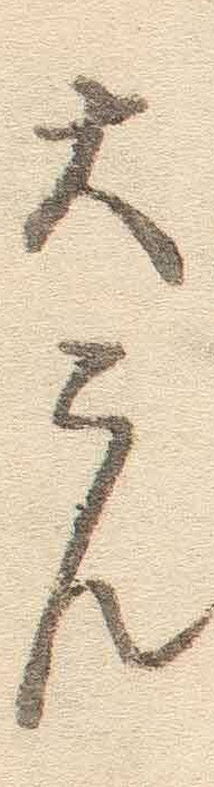大こん
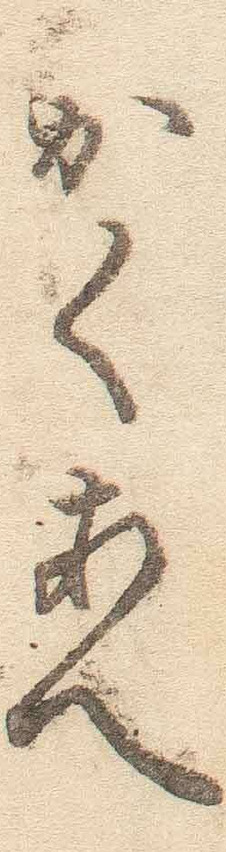かくあへ

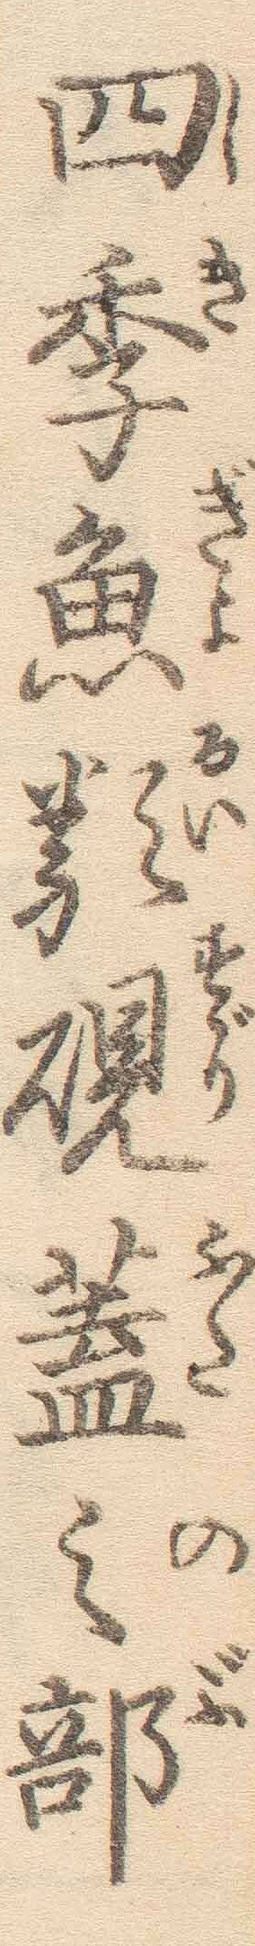四季魚類硯蓋之部
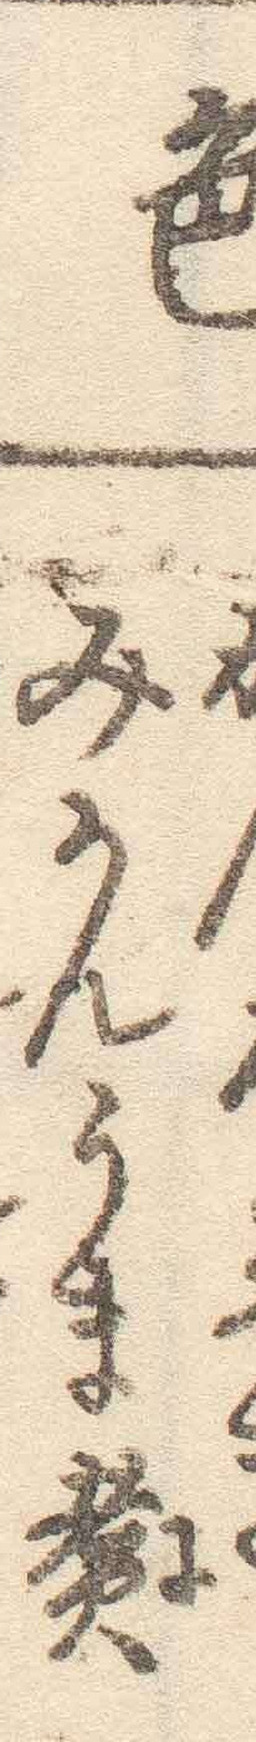みかんうま煮
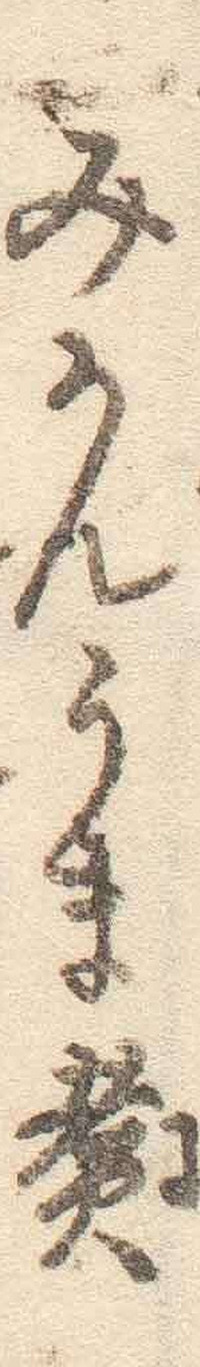みかんうま煮
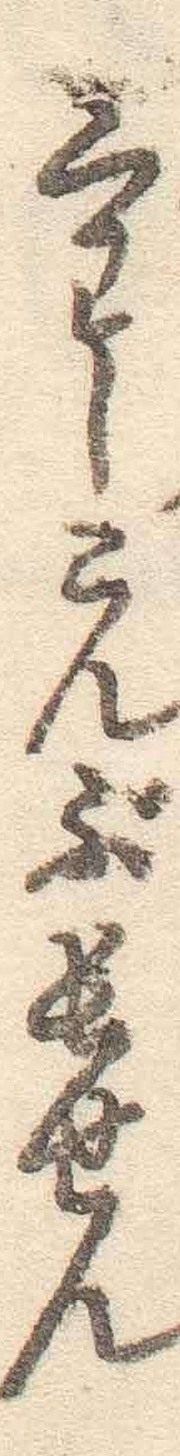くわしこんぶ長せん
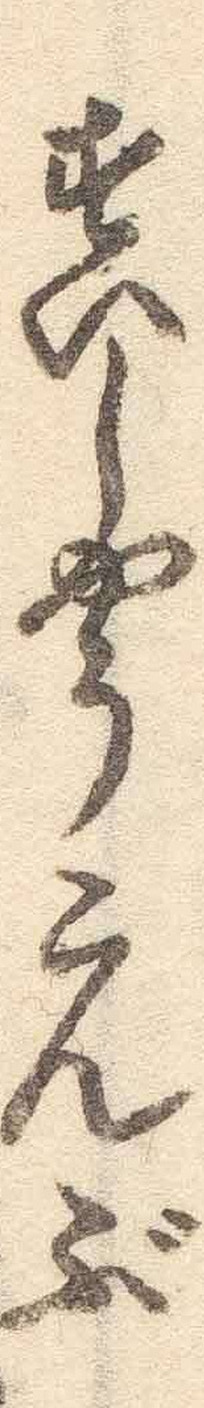すいしやうこんぶ
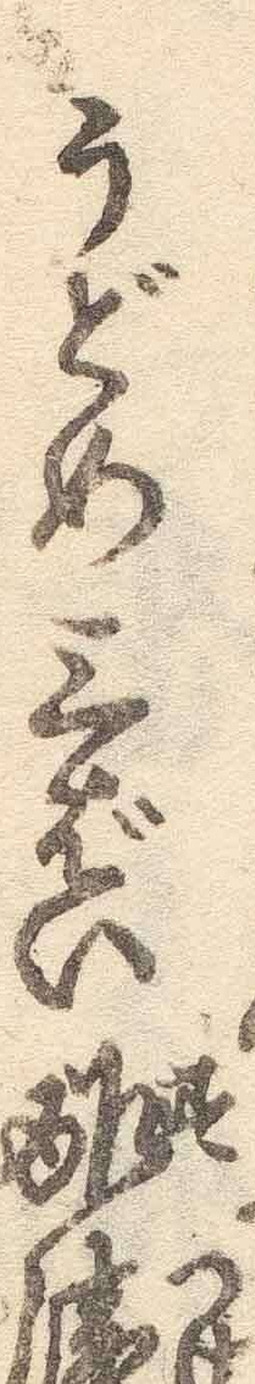うどめ三ばい酢漬
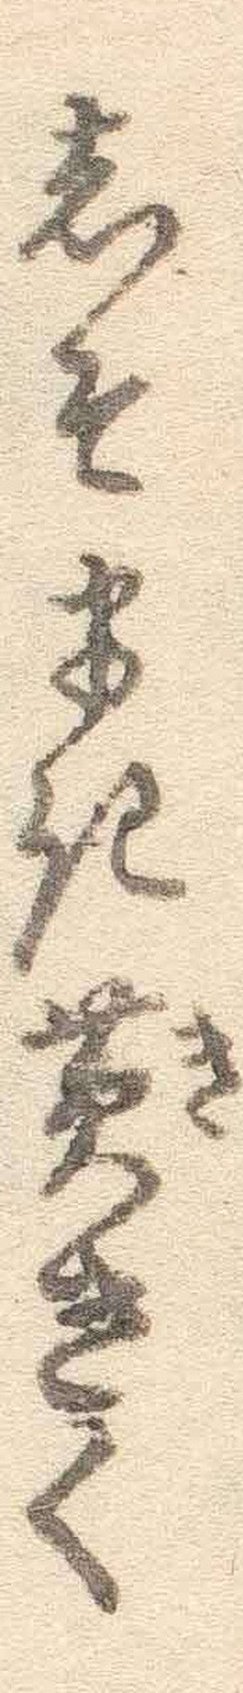しそまき黄きく
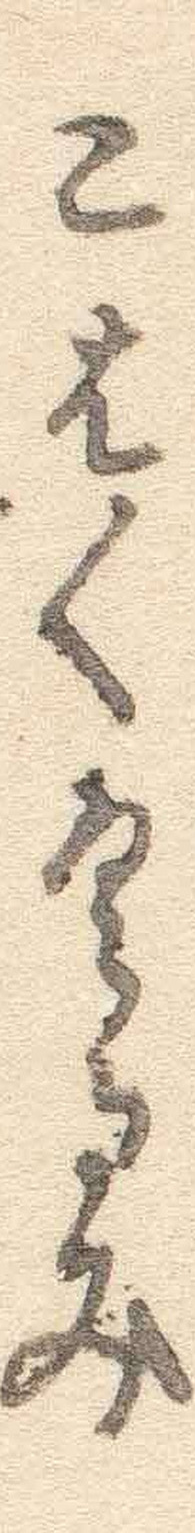こはくくるみ
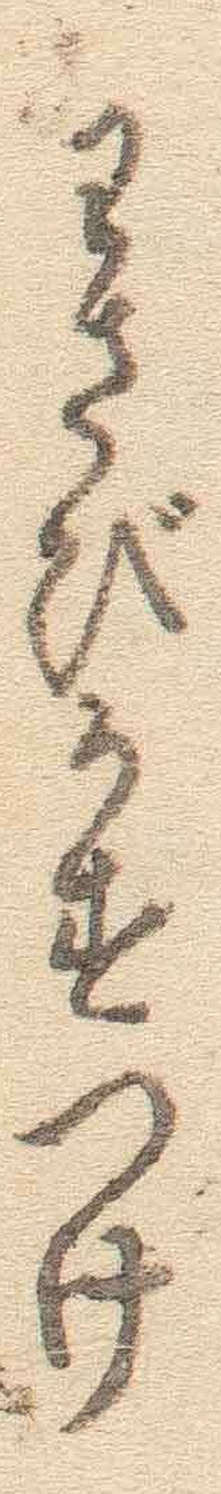わさびかすつけ

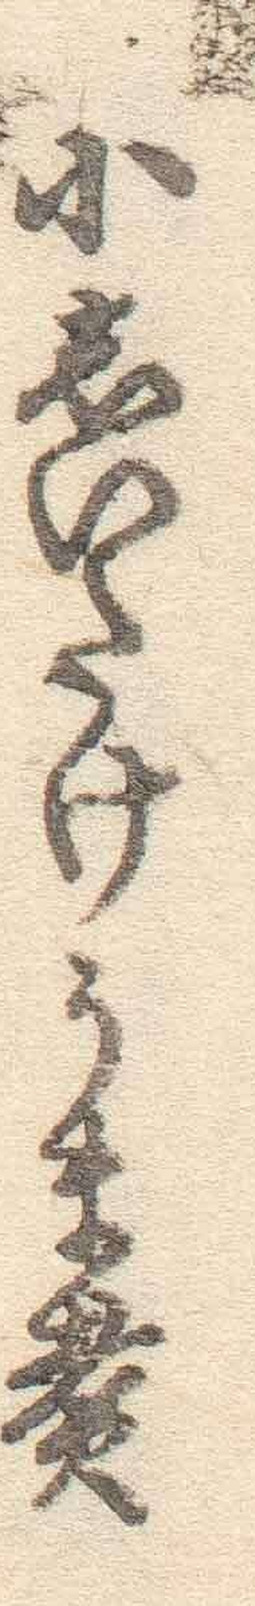小しいたけうま煮
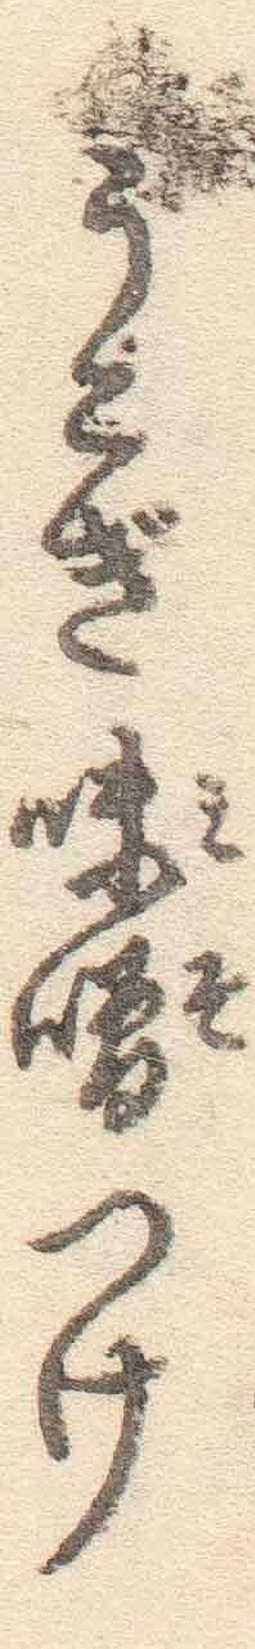うこぎ味噌つけ
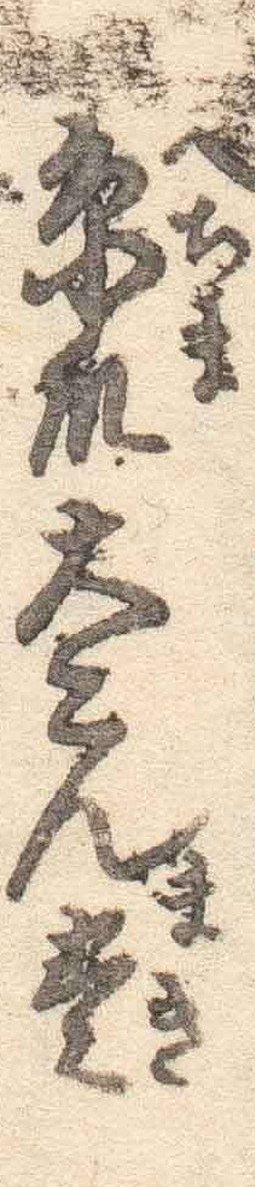糸瓜大こん巻
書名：料理通
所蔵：東京学芸大学附属図書館 国文学研究資料館
